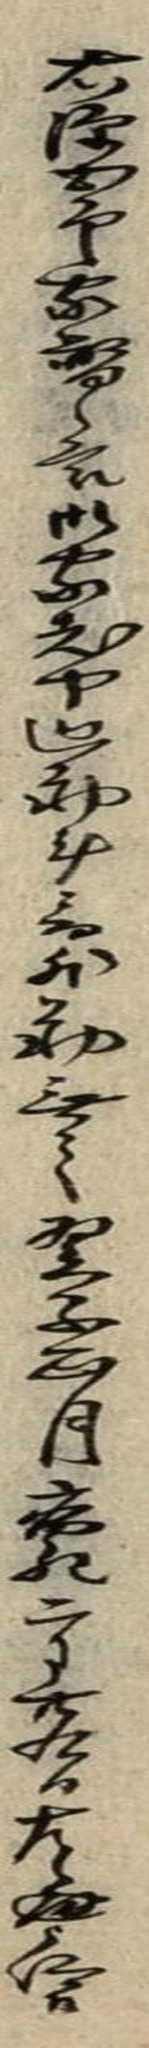右源五郎家督之節御家老中廻勤斗に而外勤無之翌子正月病死二月廿九日左之通被仰付
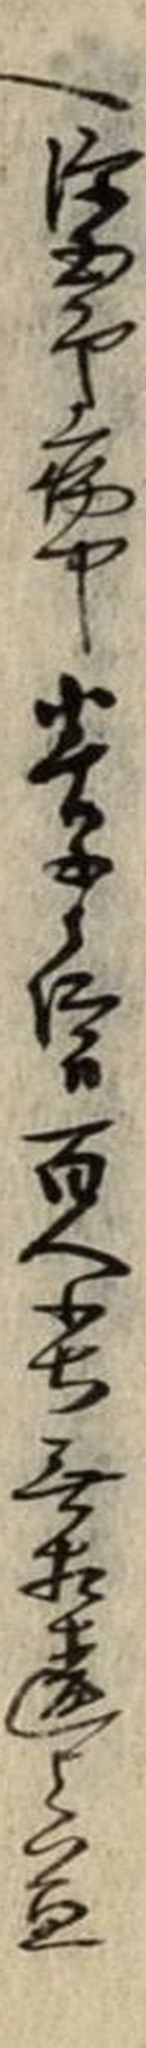源五郎病中養子被仰付百人ふち無相違被下置
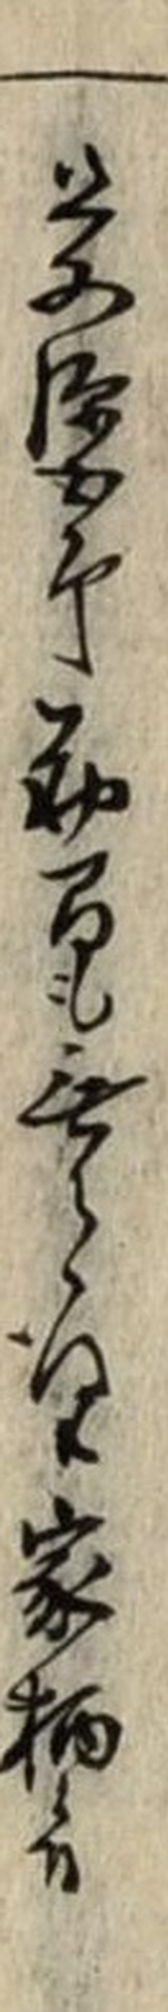且又源五郎勤間も無之候得共家柄に付
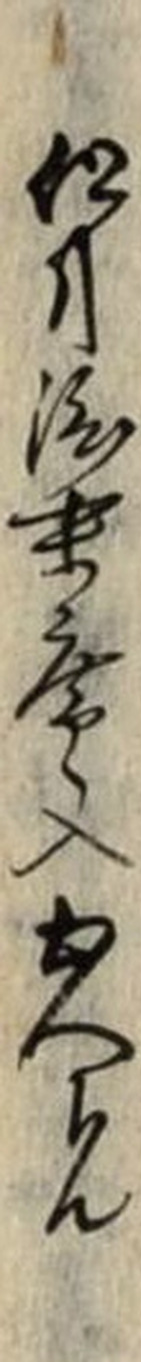但引渡未席へ入五人下ル
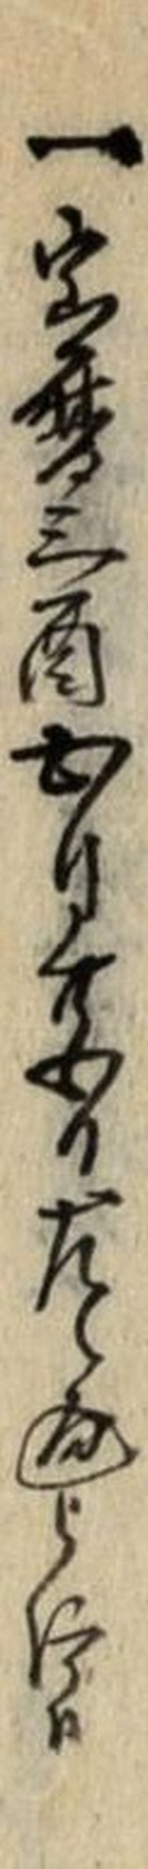一宝暦三酉五月廿五日左之通被仰付
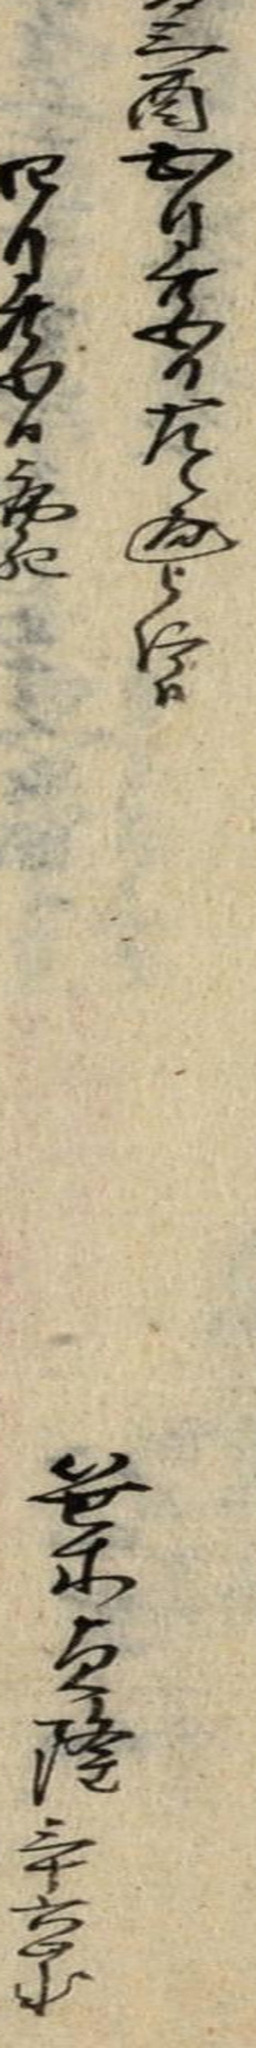四月廿五日病死笹木貞隆三十六歳
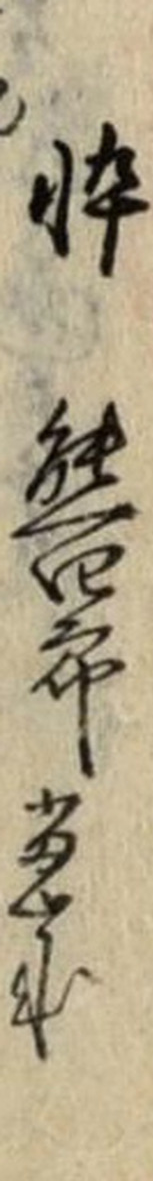忰熊四郎当歳
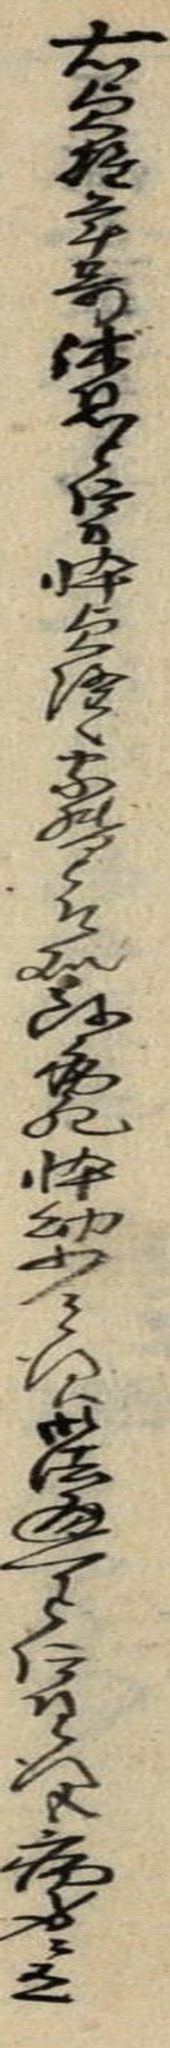右貞雄年寄休息被仰付忰貞隆へ家督被下候処致病死忰幼少に候得は御法通可被仰付候得共病身に有
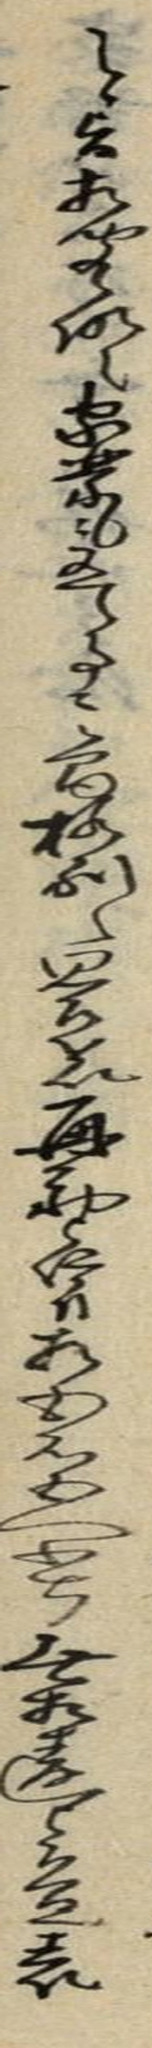之候旨相聞候仍之家業も有之候事に候間格別之思召を以再勤被仰付拾五石五人ふち無相違被下置表
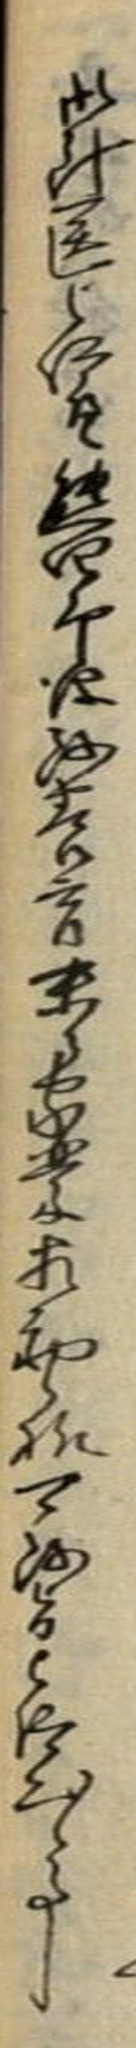御針医被仰付候熊四郎儀致養育未々家業相勤候様可致旨被仰出候事
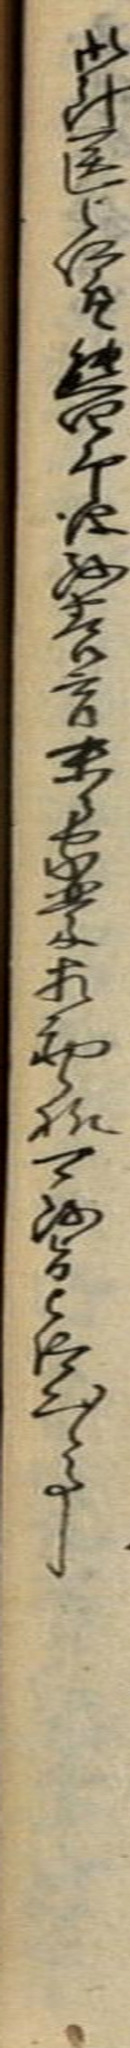御針医被仰付候熊四郎儀致養育未々家業相勤候様可致旨被仰出候事
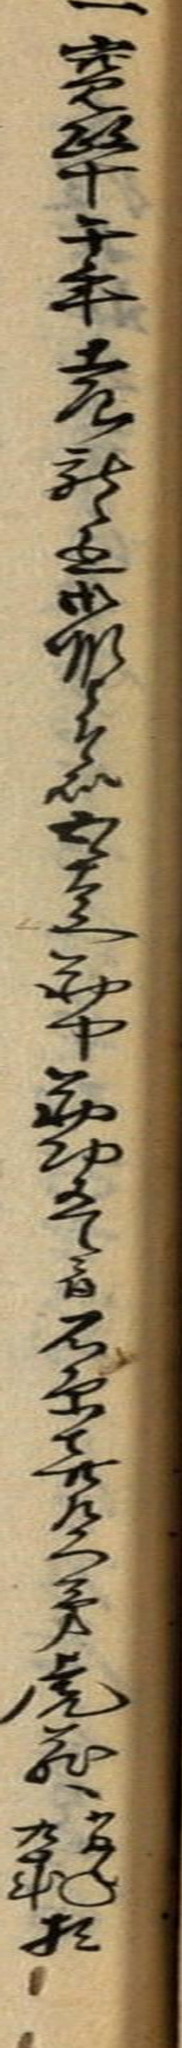一寛政十午年土屋新之丞御暇被下候処五太夫勤中勤功有之候に付石原喜左衛門方虎蔵へ当年九歳拾
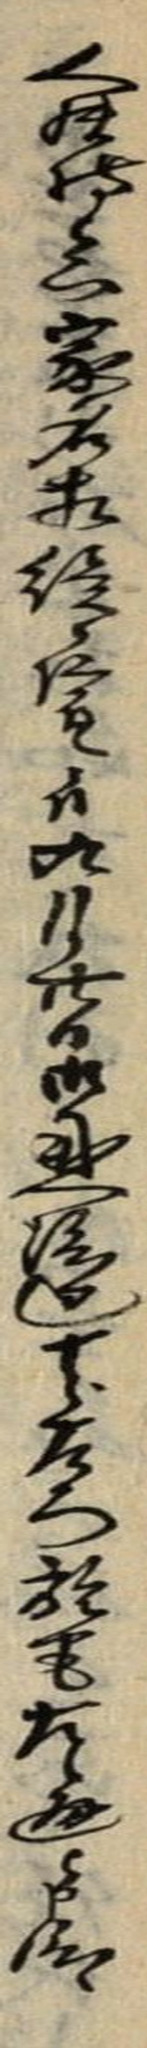人扶持被下家名相続被仰付候に付九月廿日御用人渡辺十郎左衛門於宅左之通被申渡候
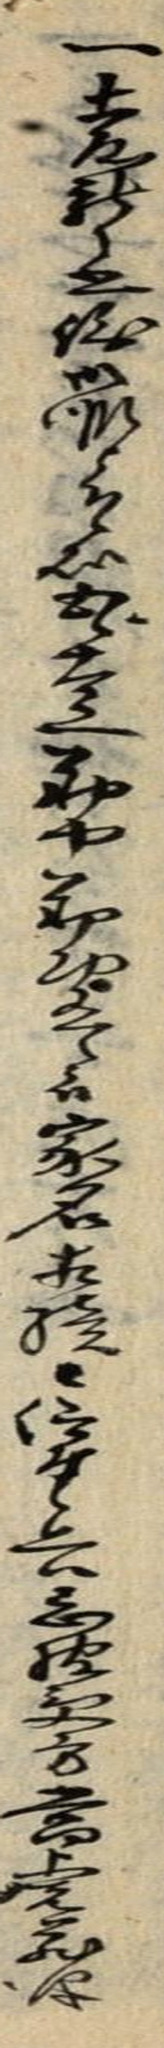一土屋新之丞儀御暇被下候処五郎太夫勤中勤功有之候に付家名相続被仰付候上は忌服受方当虎蔵儀
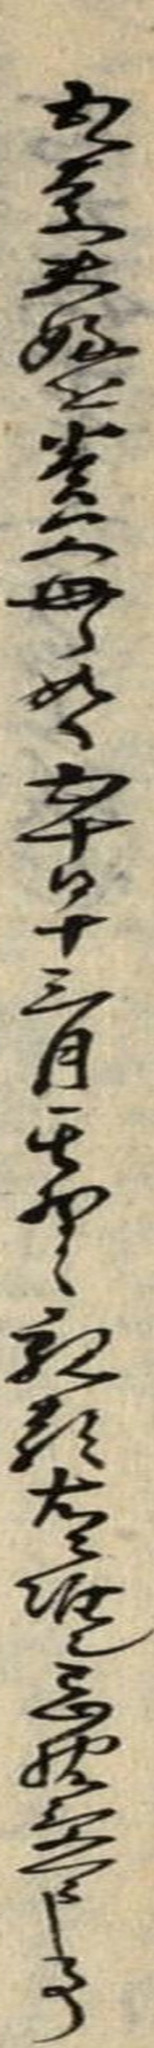五郎太夫夫婦を養父母之如く五十日十三月其外之親類右に准し忌服受可申事
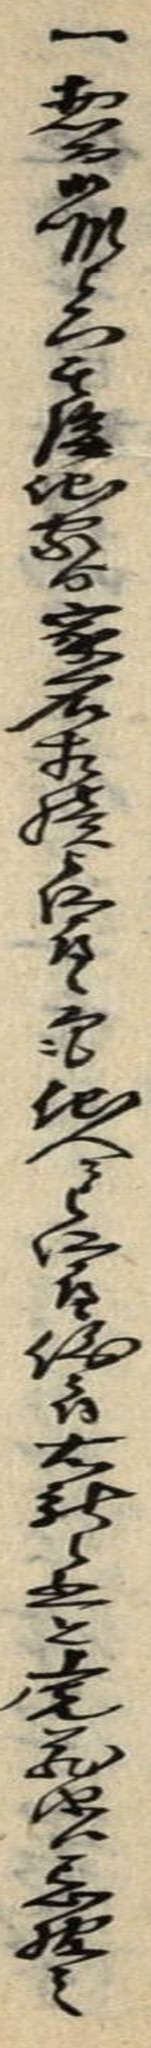一惣而御暇被下其後他家ゟ家名相続被仰付候而も他人に被仰付候儀に付右新之丞と虎蔵儀は忌服之
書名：御用并被仰出之部
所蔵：福井県文書館 Fukui Prefectural Archives
